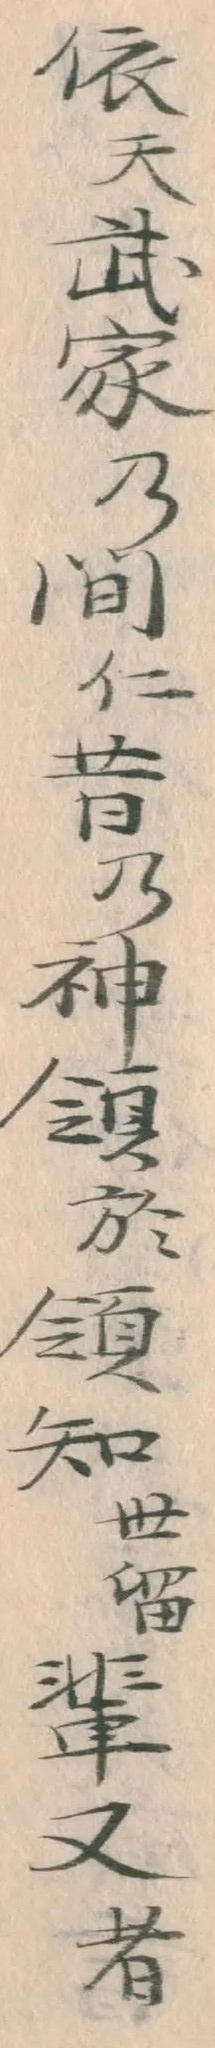依天武家乃間仁昔乃神領於領知世留輩又者
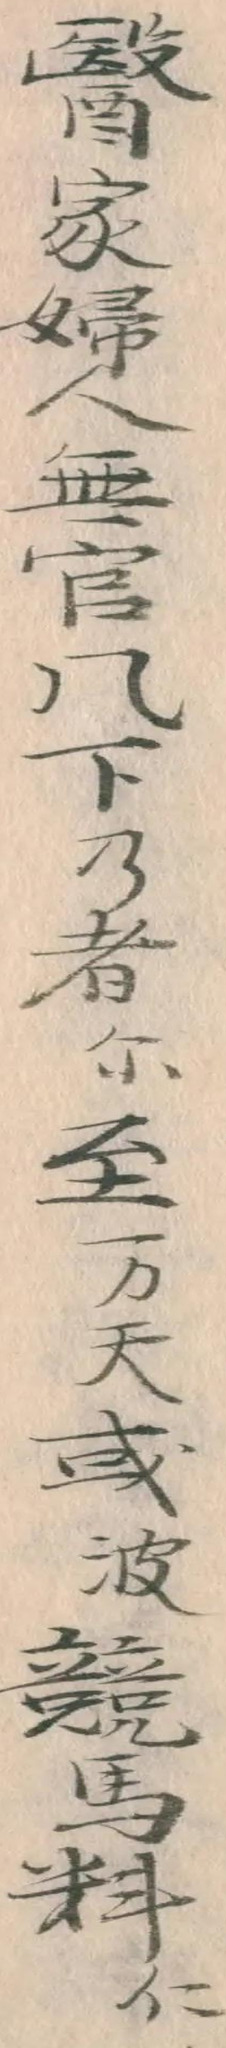醫家婦人無官凡下乃者尓至万天或波競馬料仁
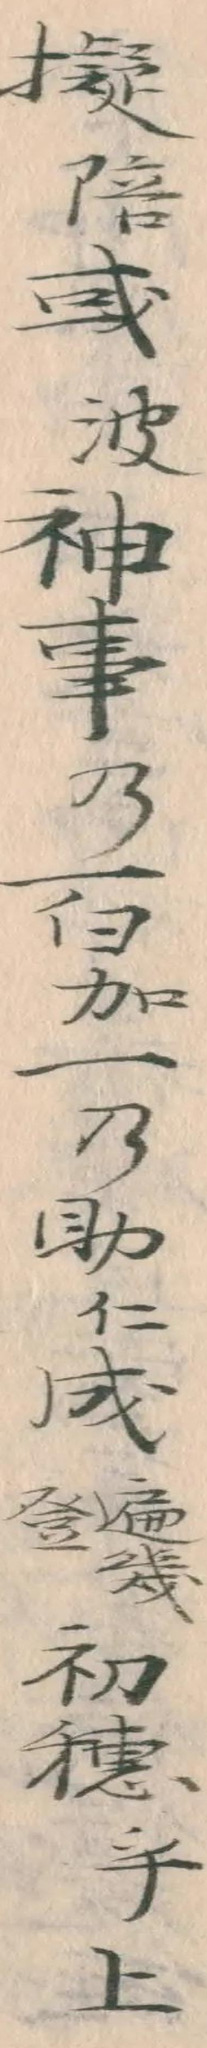擬陪或波神事乃百加一乃助仁成遍幾登初穂乎上
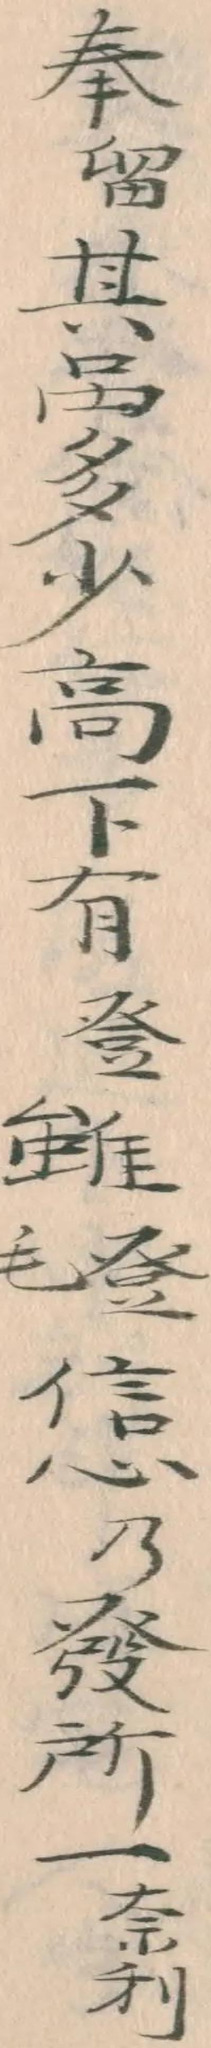奉留其品多少高下有登雖登毛信心乃發所一奈利
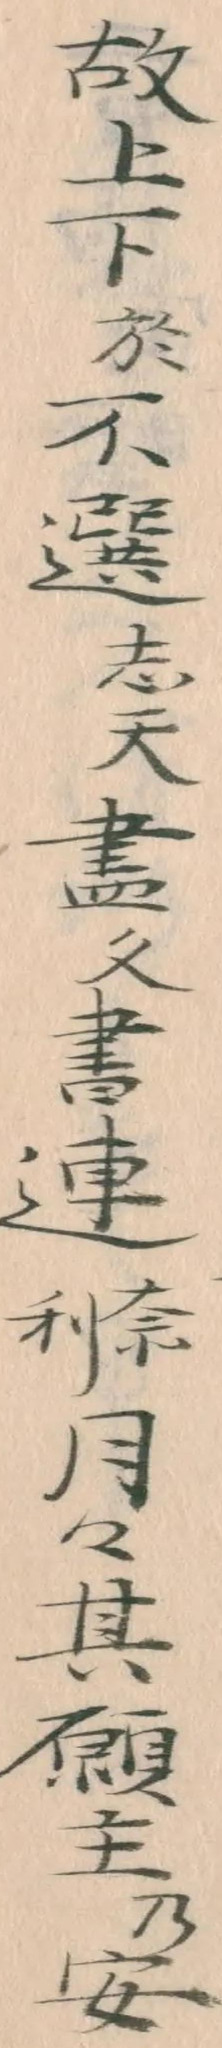故上下於不選志天盡久書連奈利月々其願主乃安
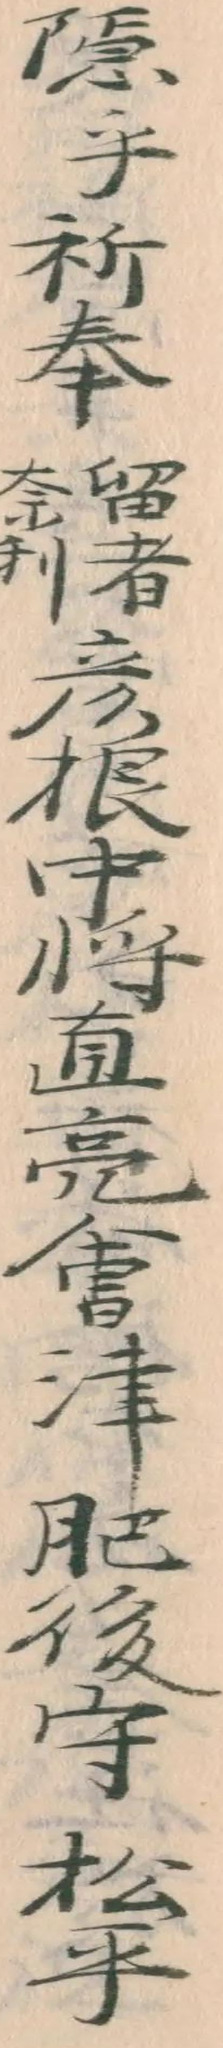隠乎祈奉留者奈利彦根中将直亮會津肥後守松平
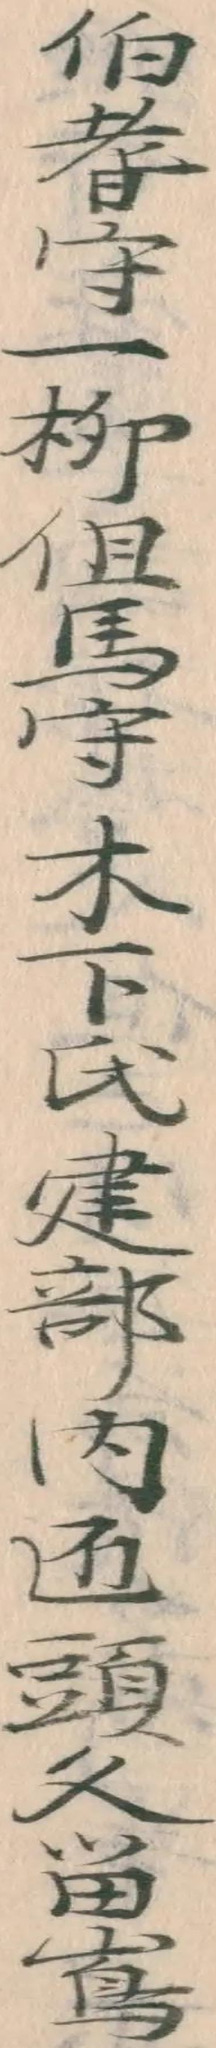伯耆守一柳但馬守木下氏建部内匠頭久留嶌
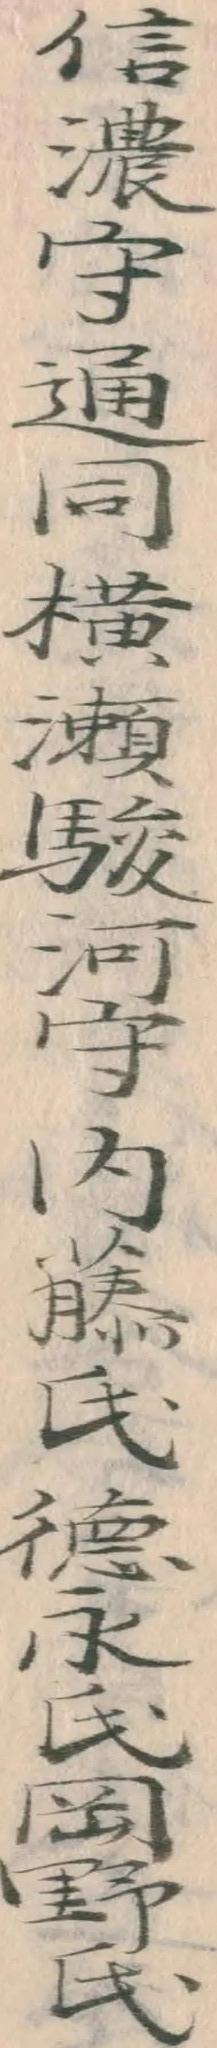信濃守通同横瀬駿河守内藤氏徳永氏岡野氏
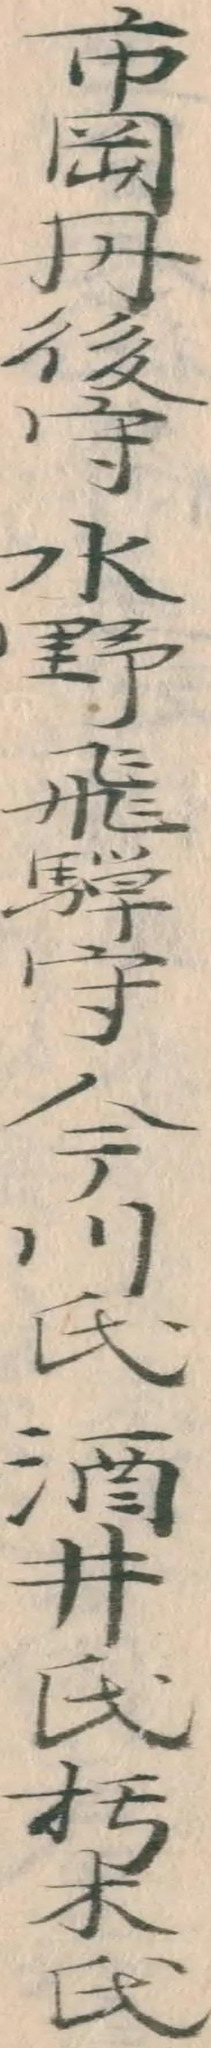市岡丹後守水野飛騨守今川氏酒井氏朽木氏
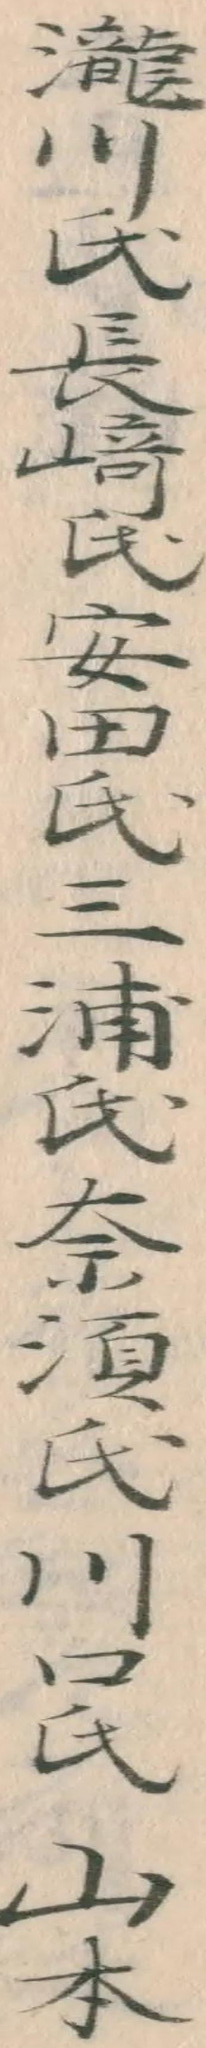瀧川氏長崎氏安田氏三浦氏奈須氏川口氏山本
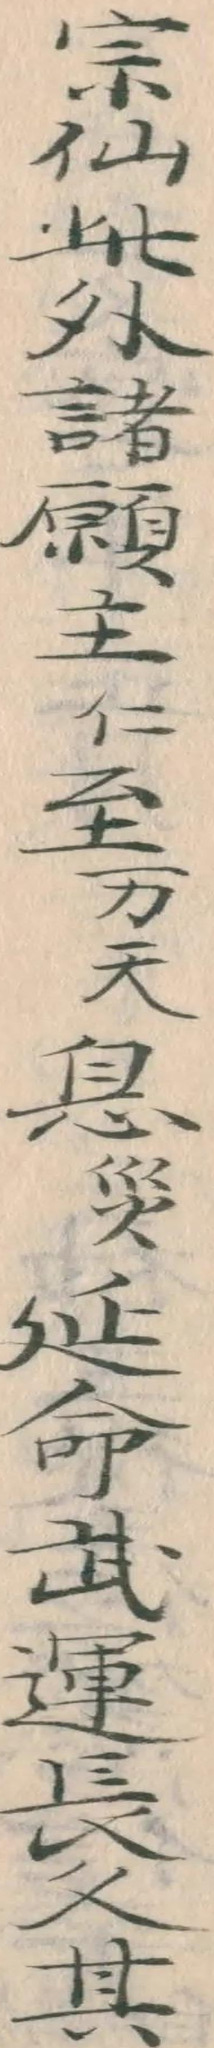宗仙此外諸願主仁至万天息災延命武運長久其
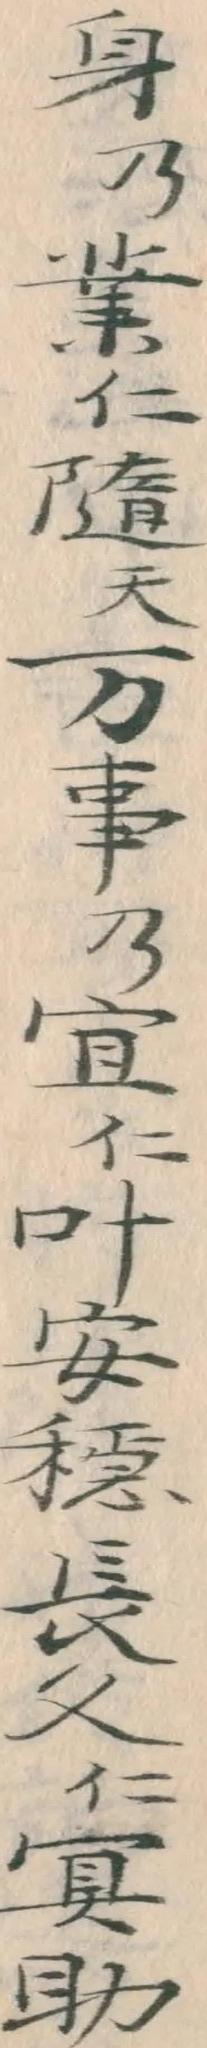身乃業仁随天万事乃宜仁叶安穏長久仁冥助
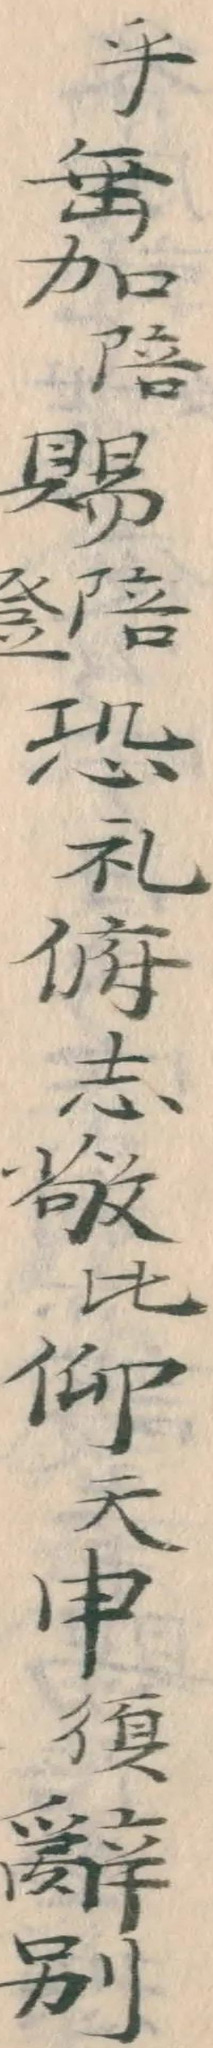乎垂加陪賜陪登恐礼俯志敬比仰天申復敷辭別
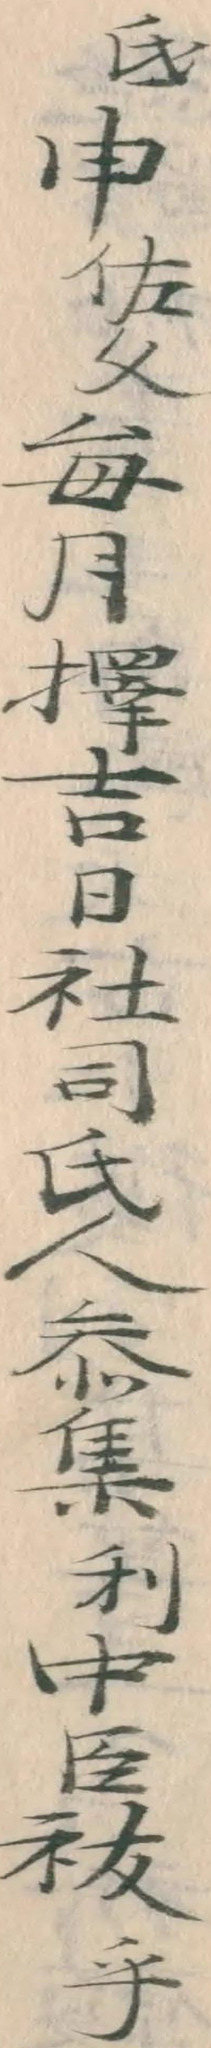氐申佐久毎月擇吉日社司氏人参集利中臣祓乎
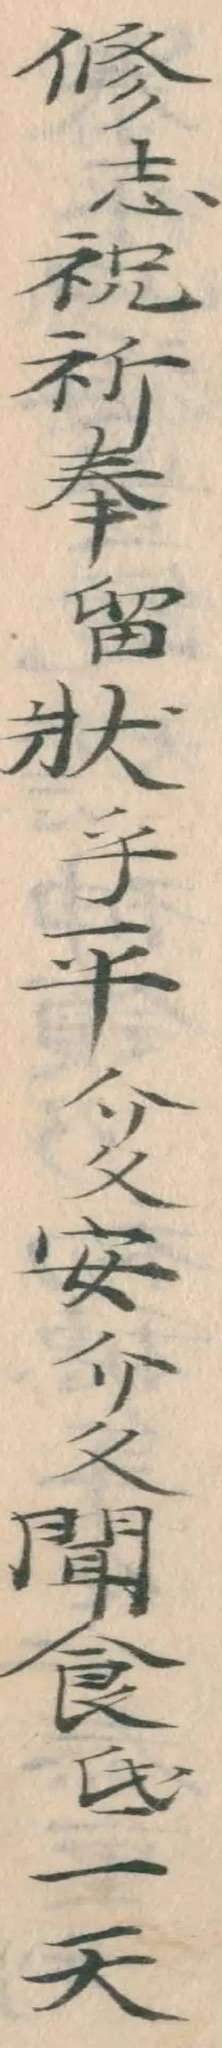修志祝祈奉留状乎平介久安介久聞食氐天

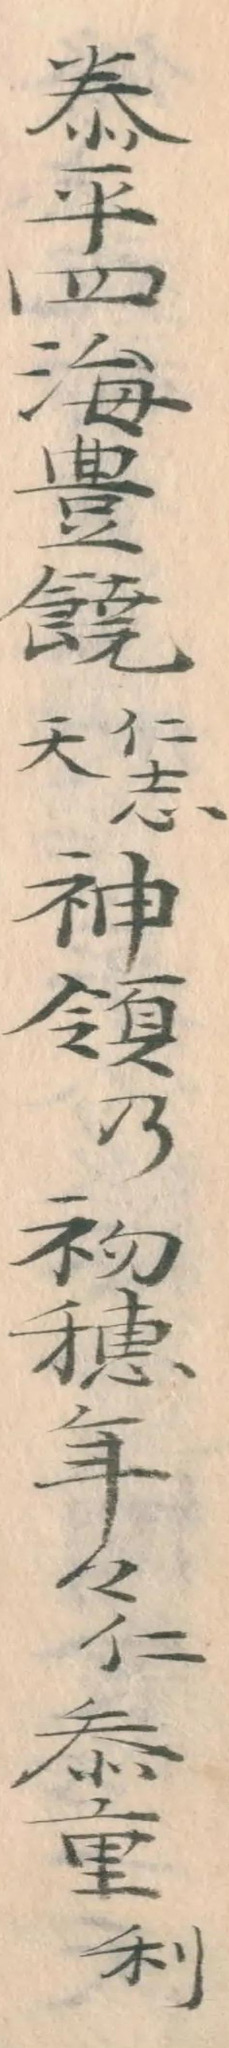泰平四海豊饒仁志天神領乃初穂年々仁参重利
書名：賀茂社記録. 第73冊
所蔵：国立国会図書館 National Diet Library, JAPAN
